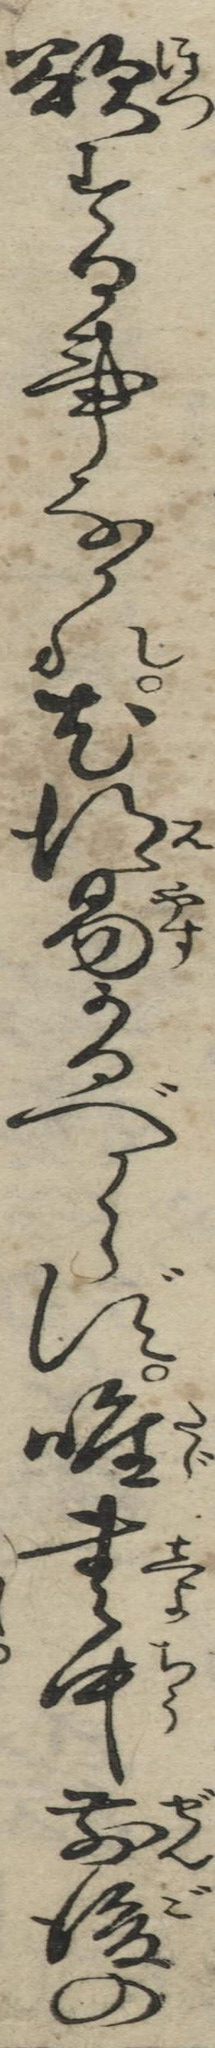欲する事なかれ。尤得易かるべからず。唯書中前後の
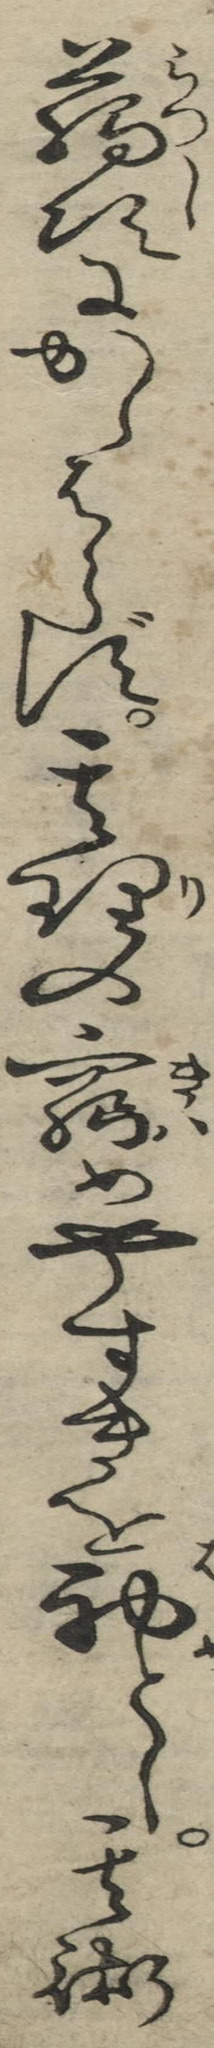臈次にかゝはらず。其理の窮めやすきを初とし。其術

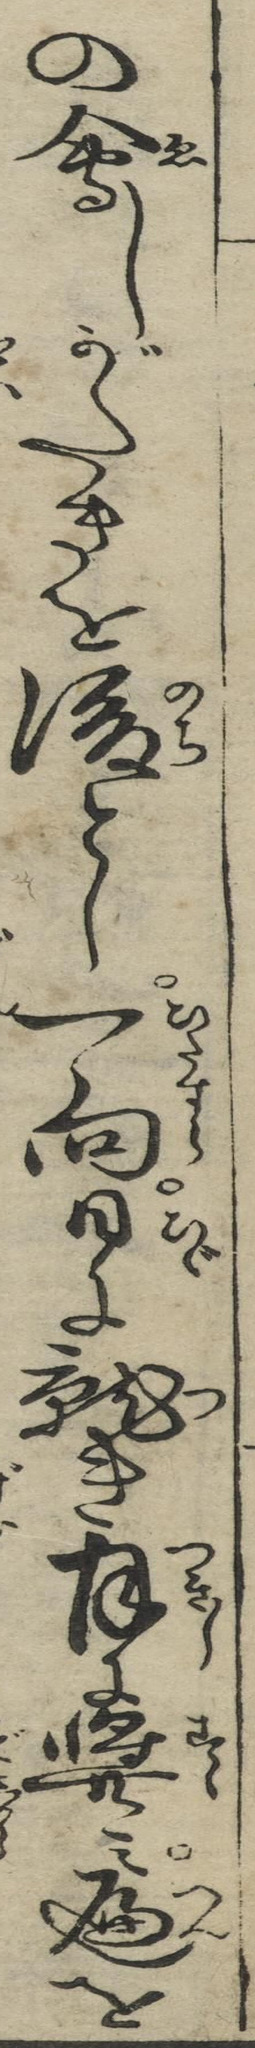の会しがたきを後とし。一向。日に就き月に奨み。遍を
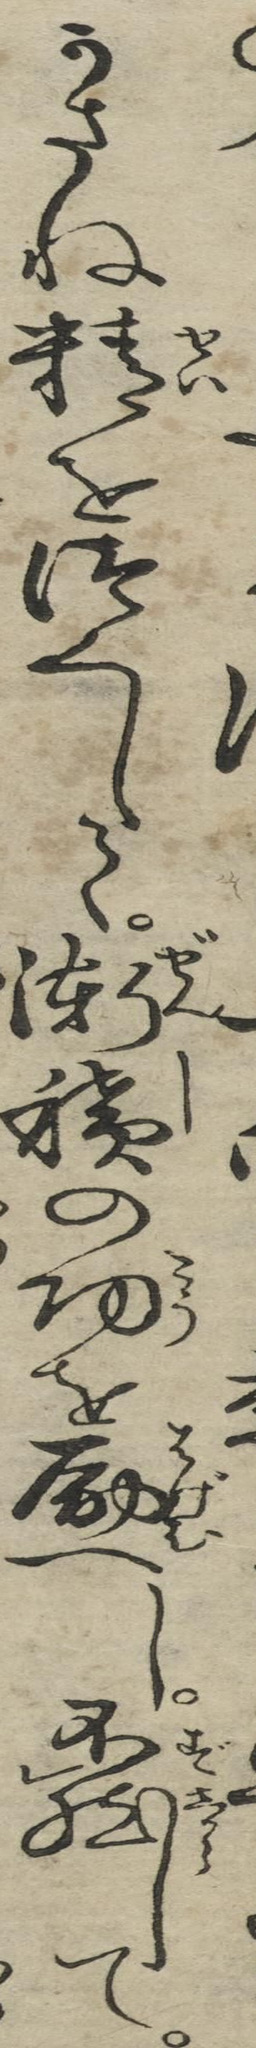かさね精をつくして。漸積の功を励へし。不然して。
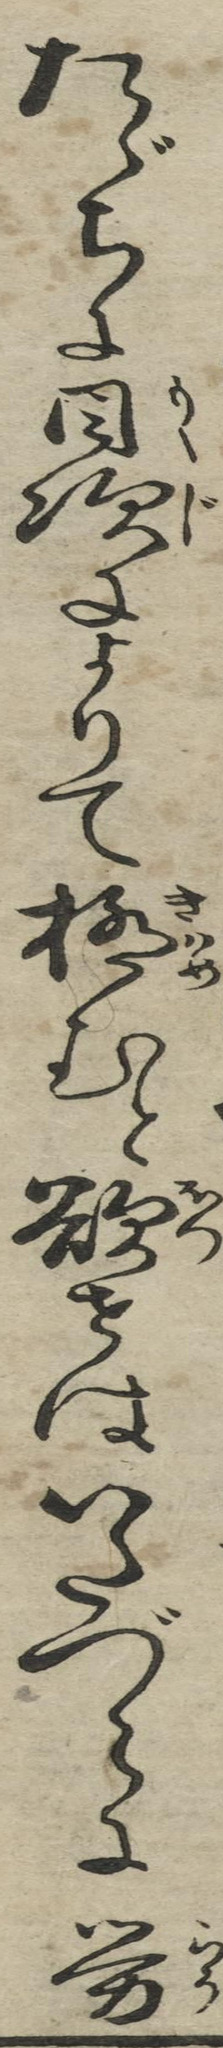ただちに目次によりて極むと欲せはいたづらに労
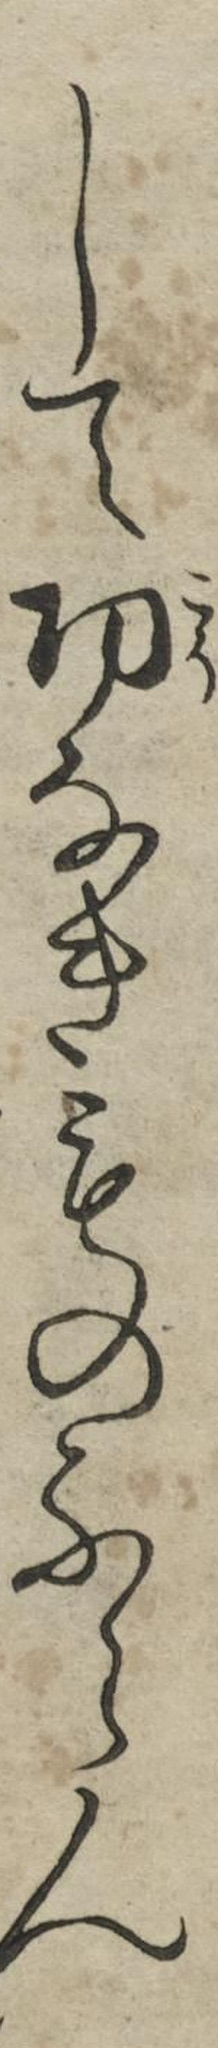して功なきものならん
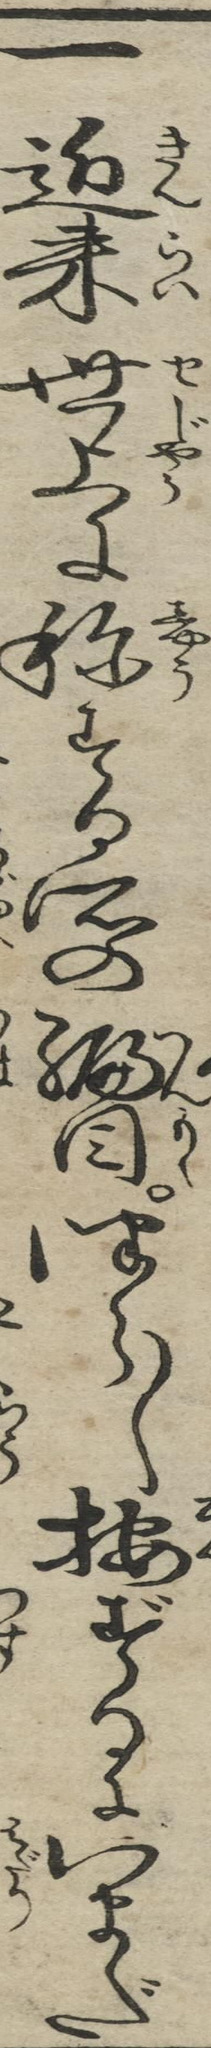一近来世上に称する所の編目。つら〳〵按ずるにいまだ
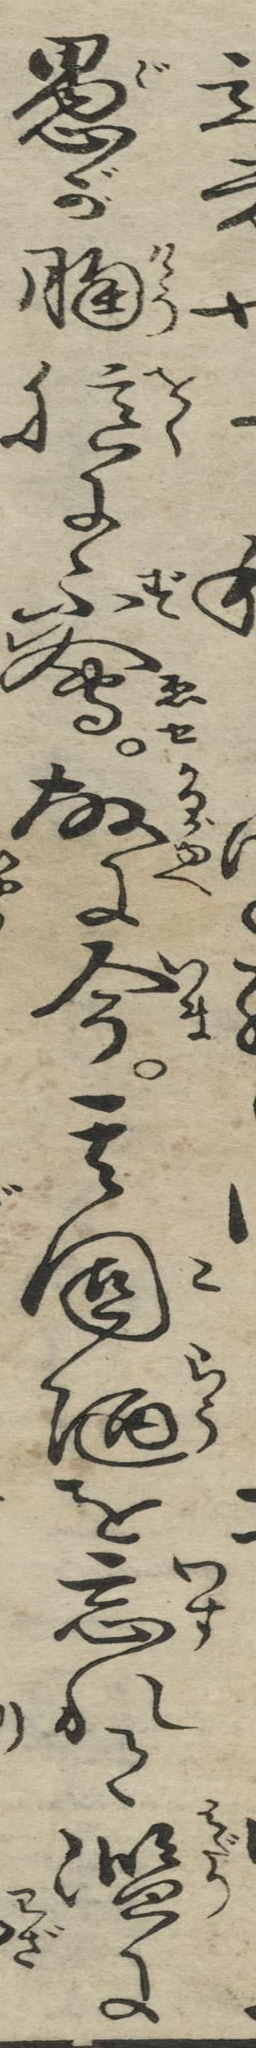愚が胸臆に不会。故に今。其固陋を忘れて濫に
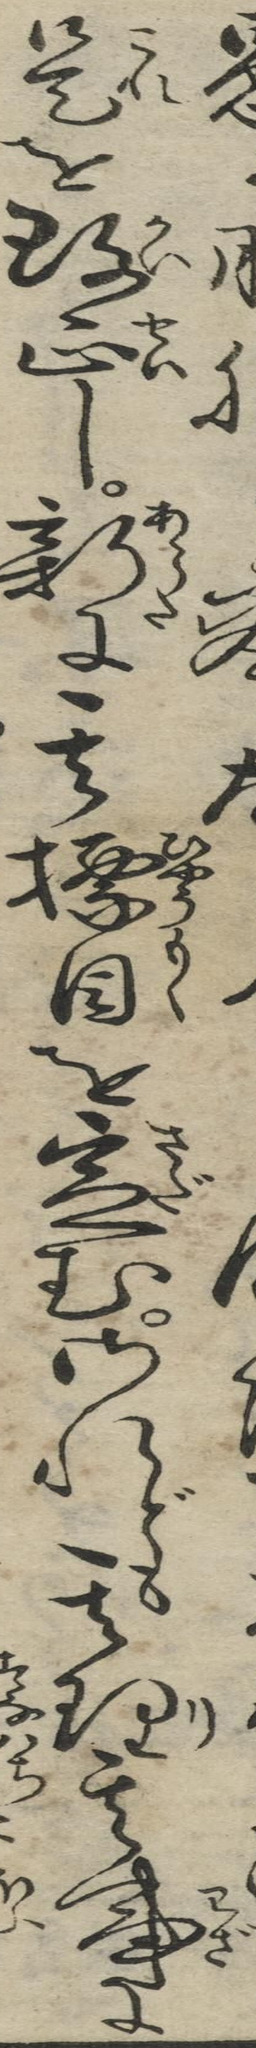是を改正し。新に其標目を定む。されども其理其事に
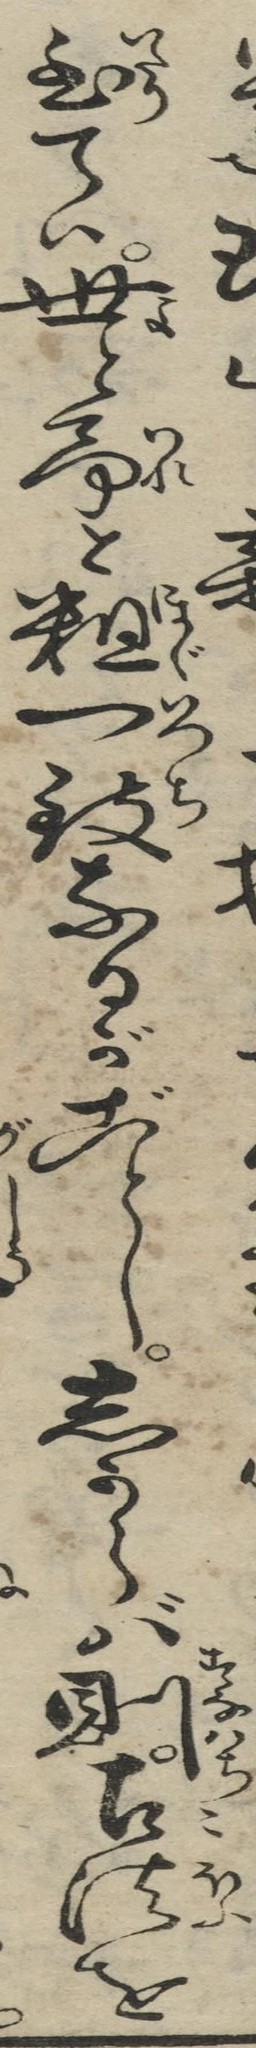至ては。世と予と粗一致なるがごとし。しからば則。古法を
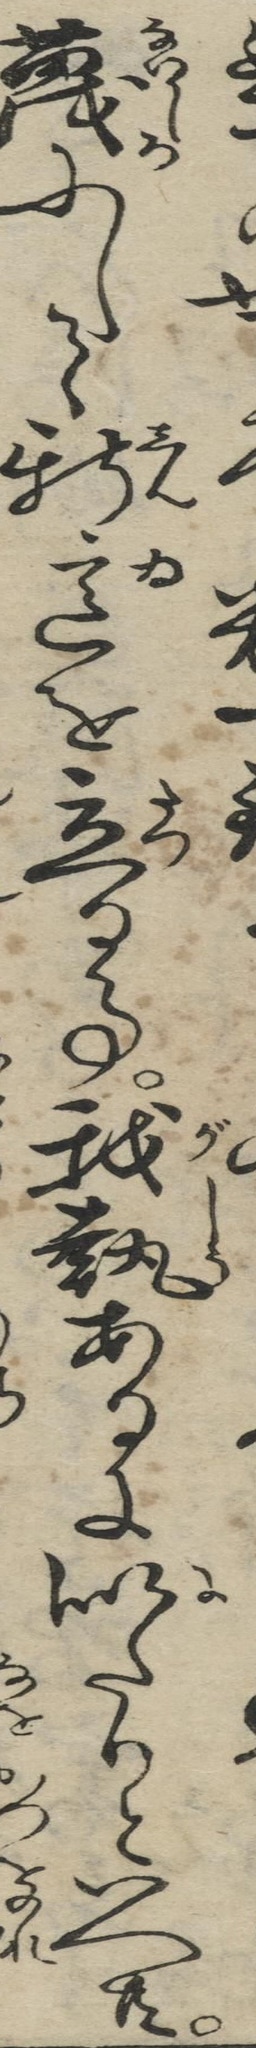蔑にして新意を立る事。我執あるに似たりといへども。
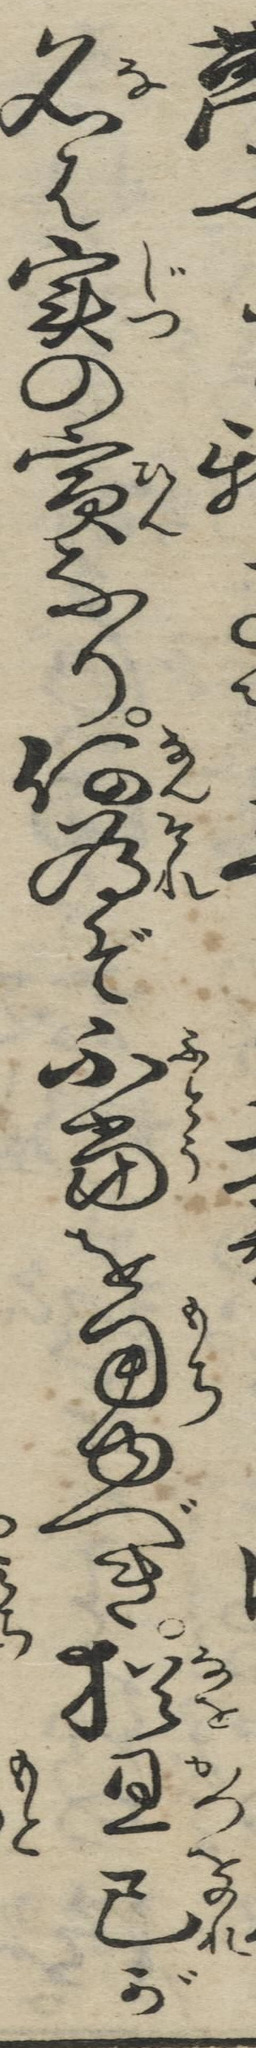名は実の賓なり。何為ぞ不当を用ゆべき。猶且己が
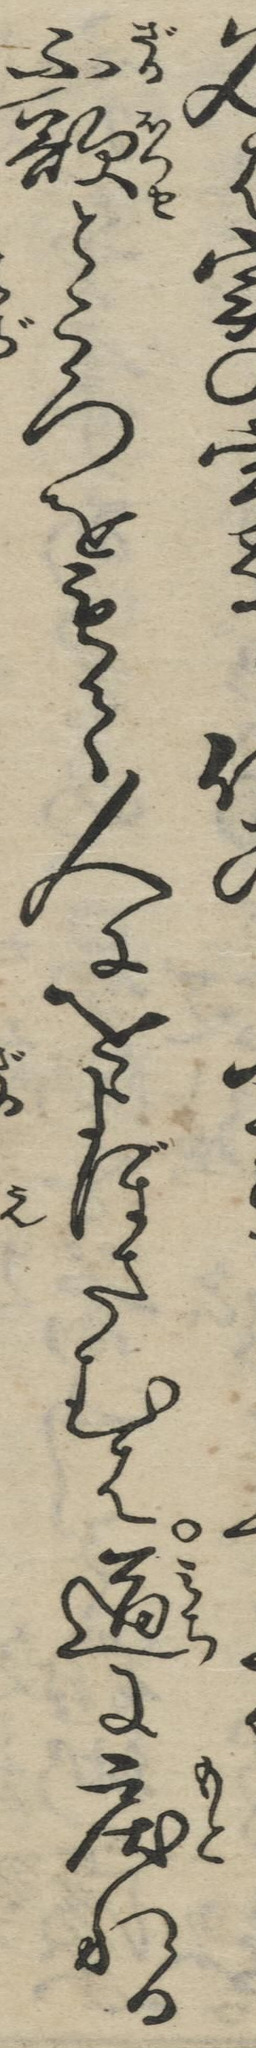不欲ところをもて人にをよぼさむは。道に戻れる
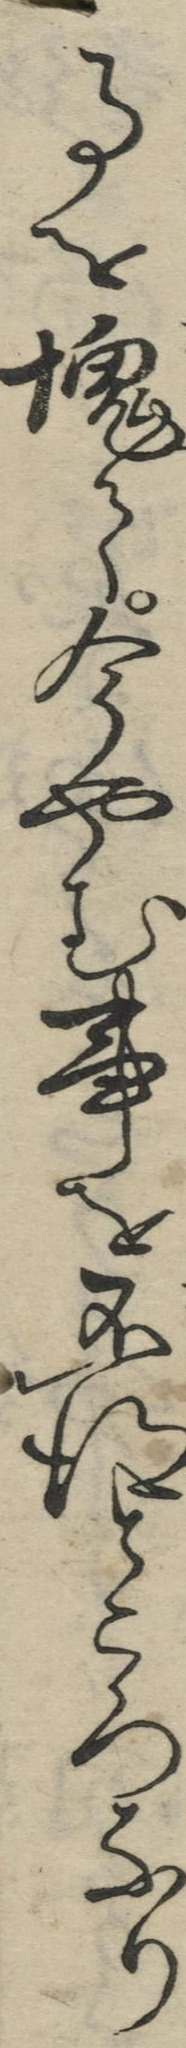事を愧て。今やむ事を不得ところなり
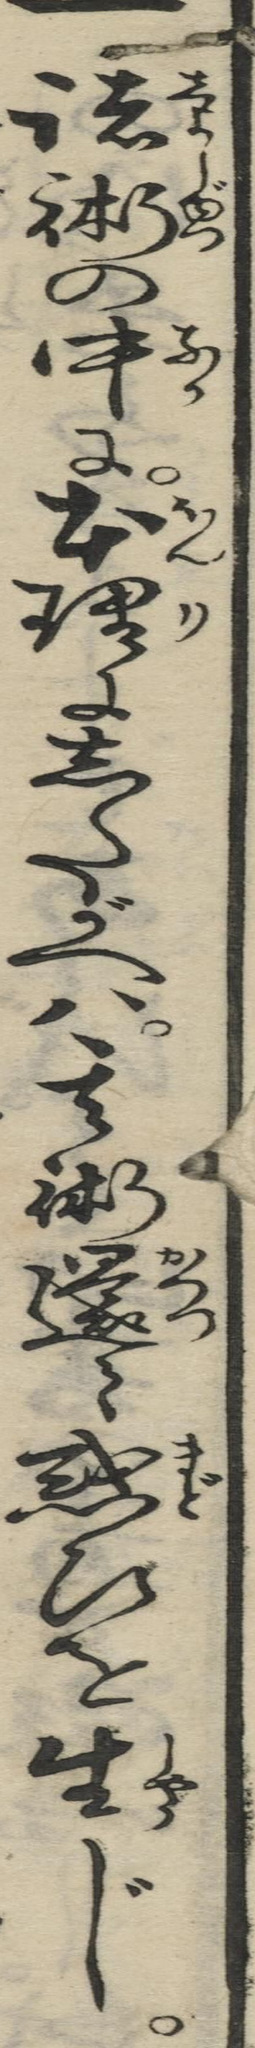一諸術の中に。本理にしたがへば。其術還て惑ひを生じ。
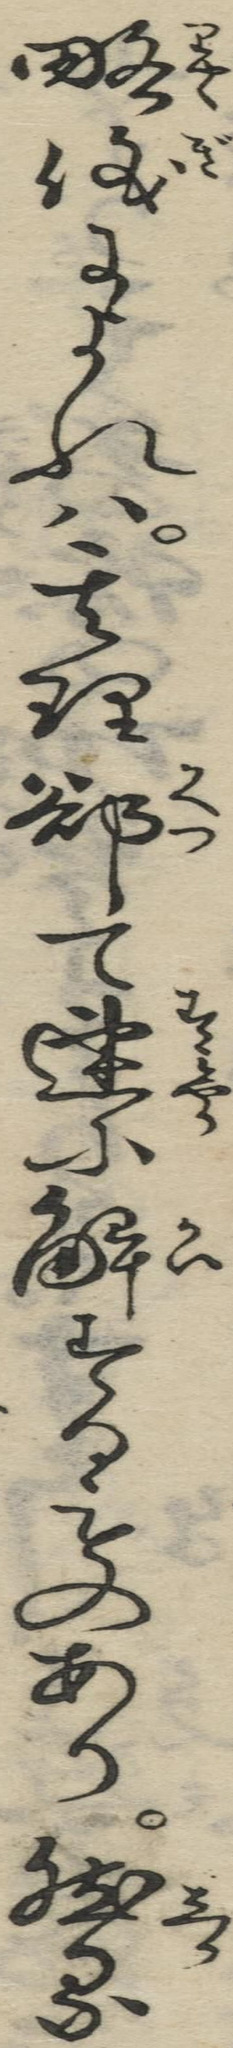略儀によれば。其理郤て速に解するものあり。然るか
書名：量地指南　巻之一（内題）
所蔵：東京大学地震研究所図書室 Earthquake Research Institute Library, The University of Tokyo, JAPAN
